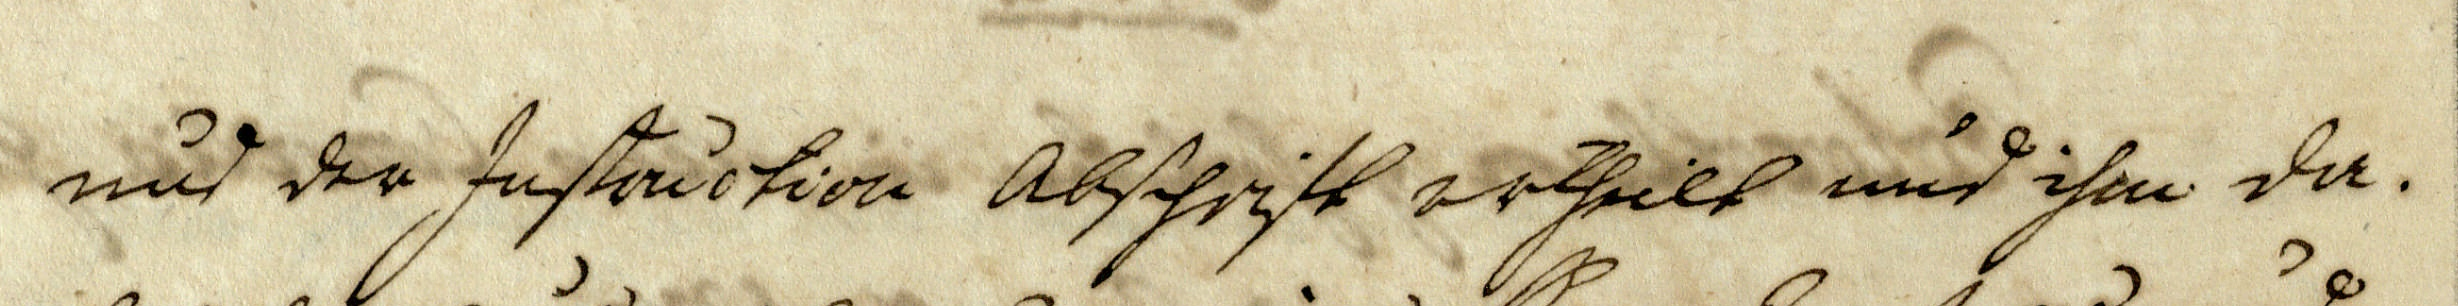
und der Instruction Abschrift ertheilt und ihm da¬
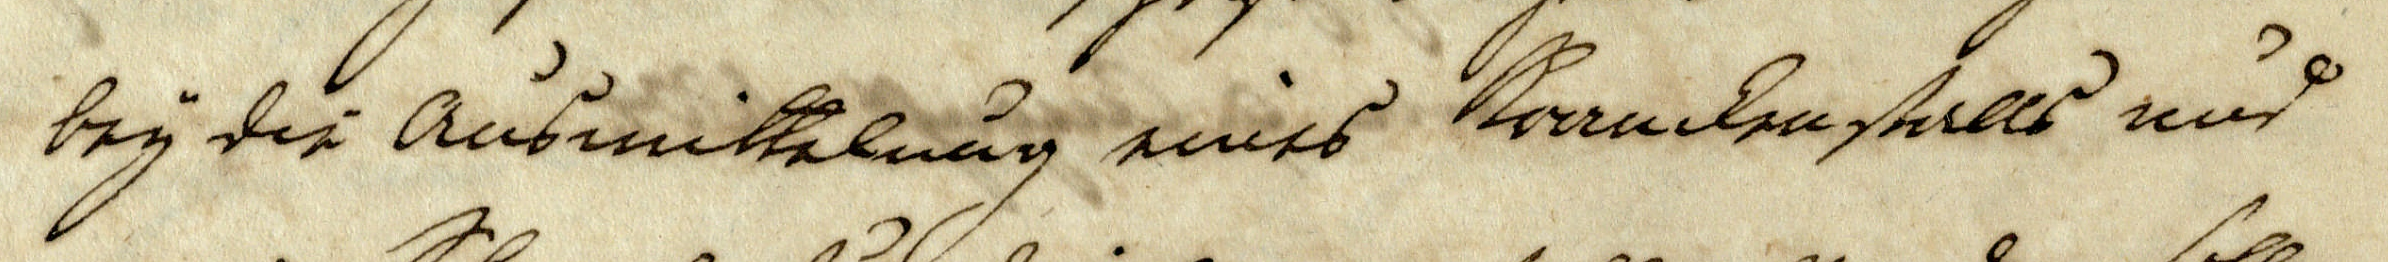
beÿ die Ausmittelung eines Krankenstalls und
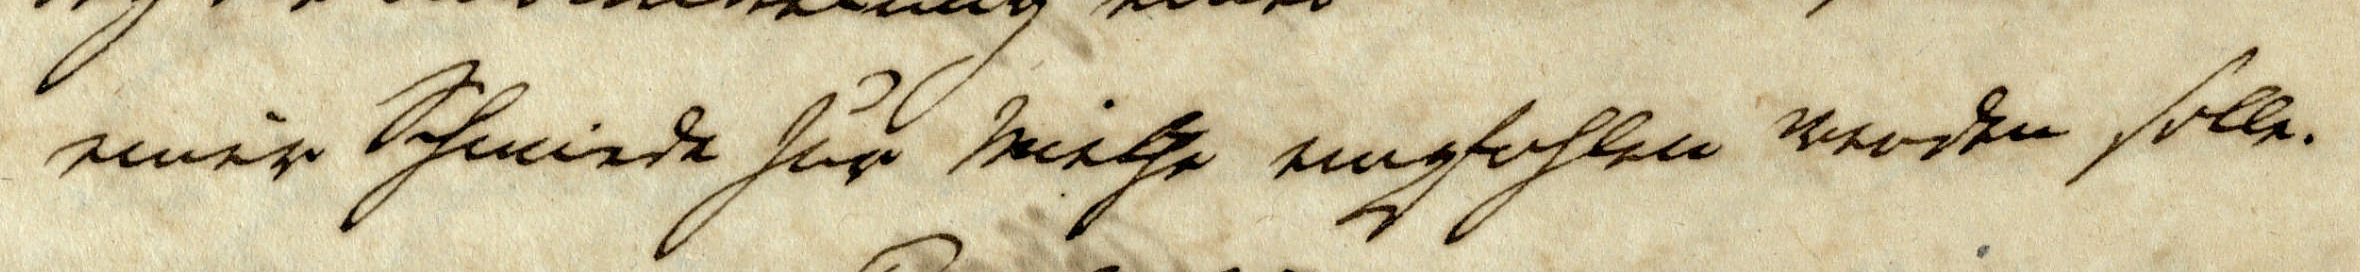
einer Schmiede zur Miethe empfohlen werden solle.
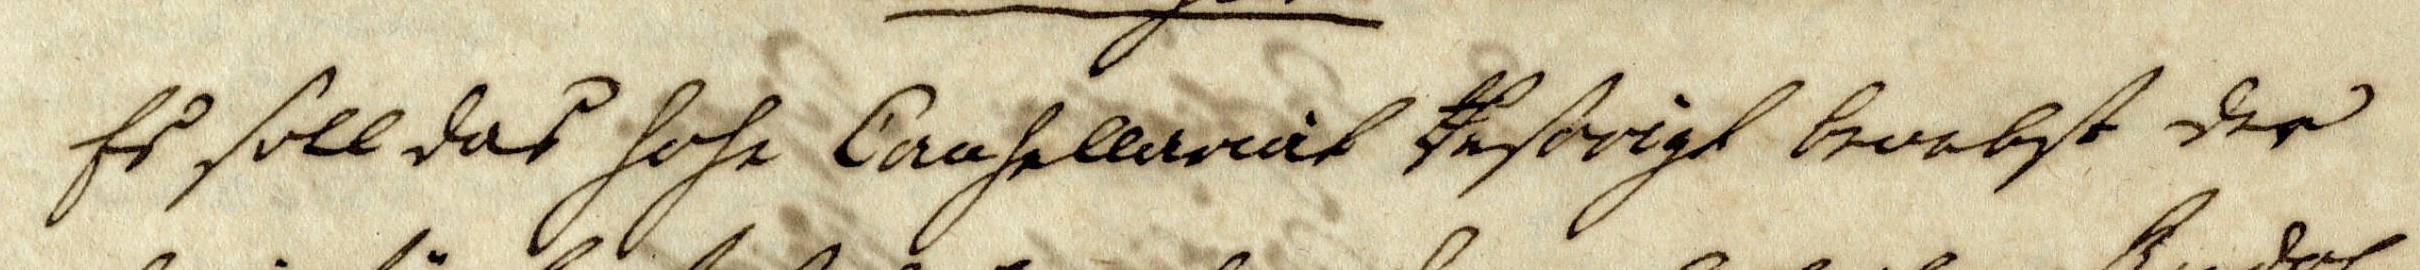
Es soll das hohe Canzellariat Rescript benebst der
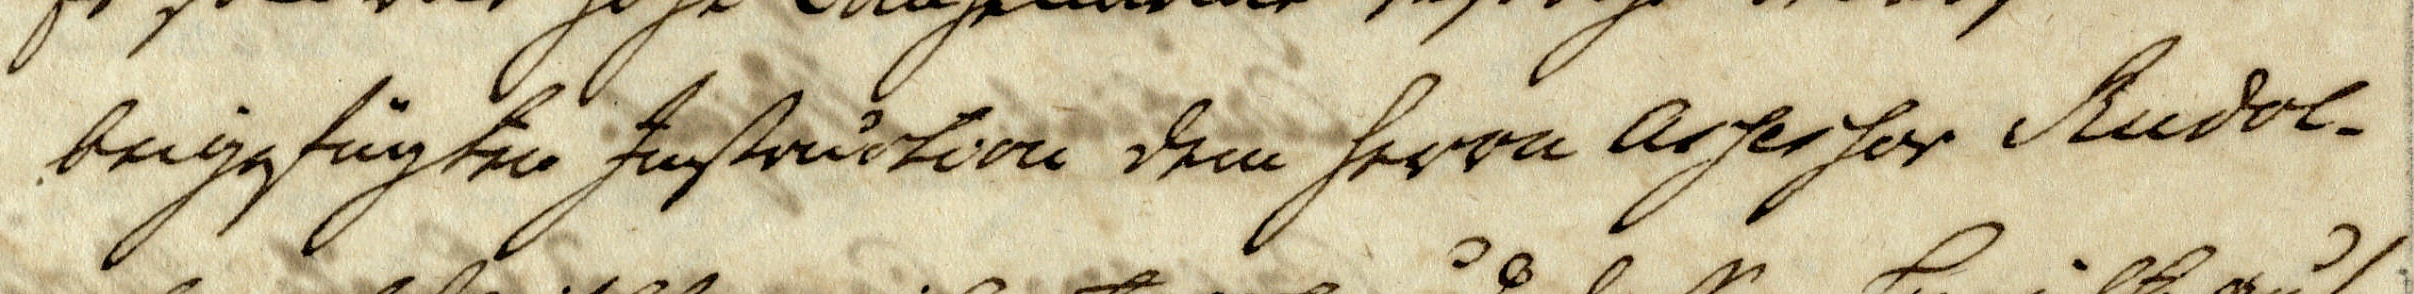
beigefügten Instruction dem Herrn Assessor Rudol¬
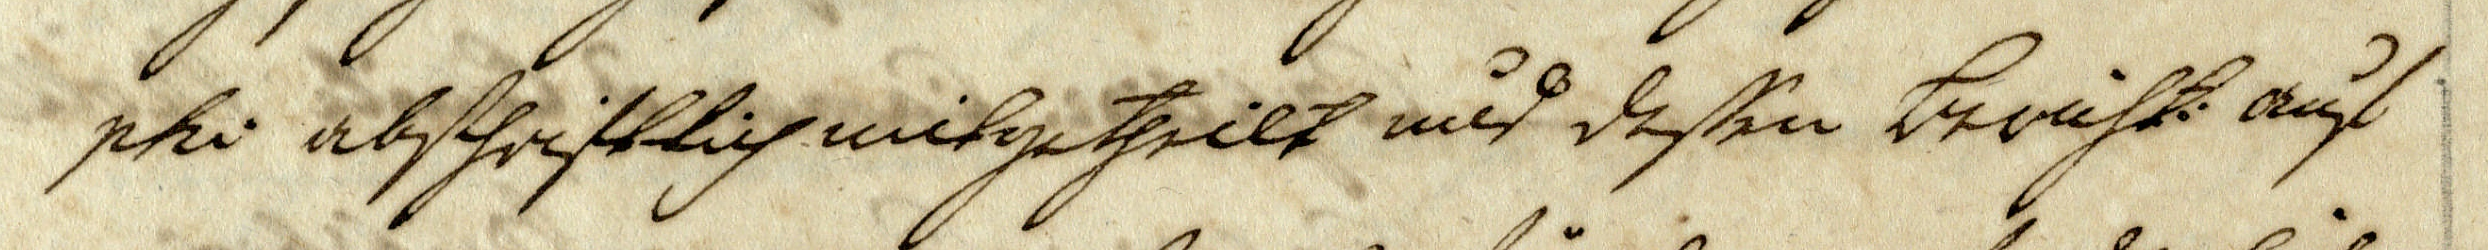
phi abschriftlich mitgetheilt und dessen Bericht auf
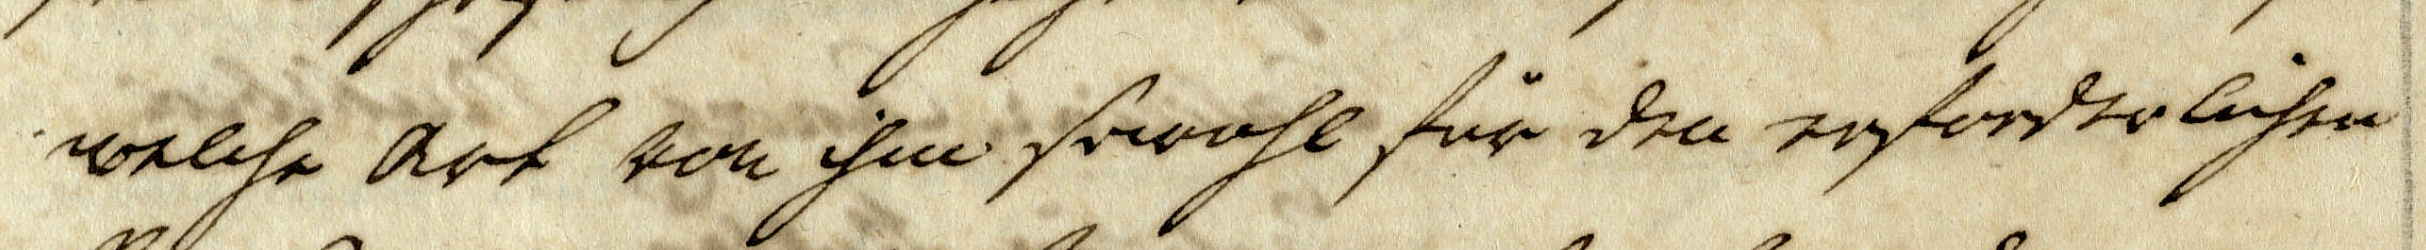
welche Art von ihm sowohl für den erforderlichen
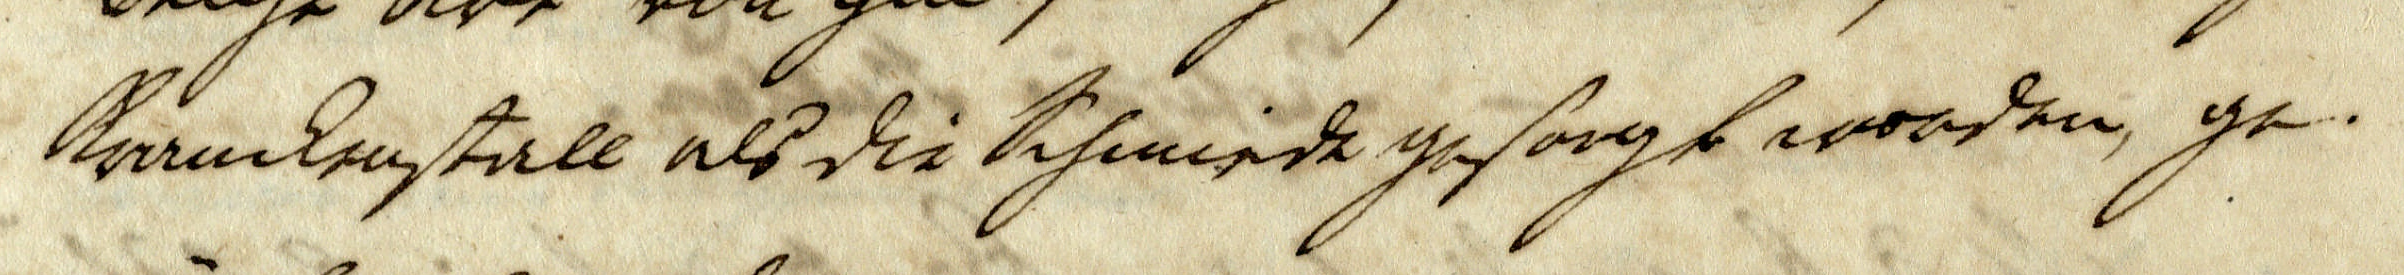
Krankenstall als die Schmiede gesorgt werden, ge¬
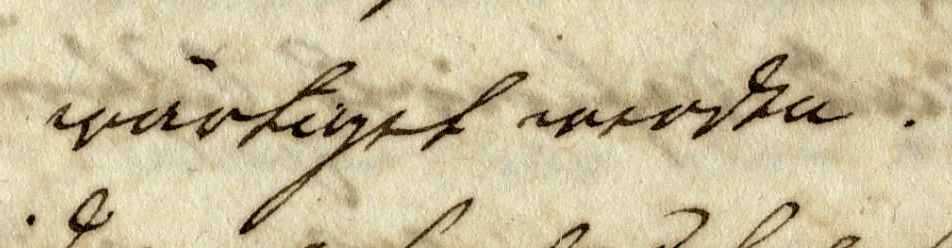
wärtiget werden.
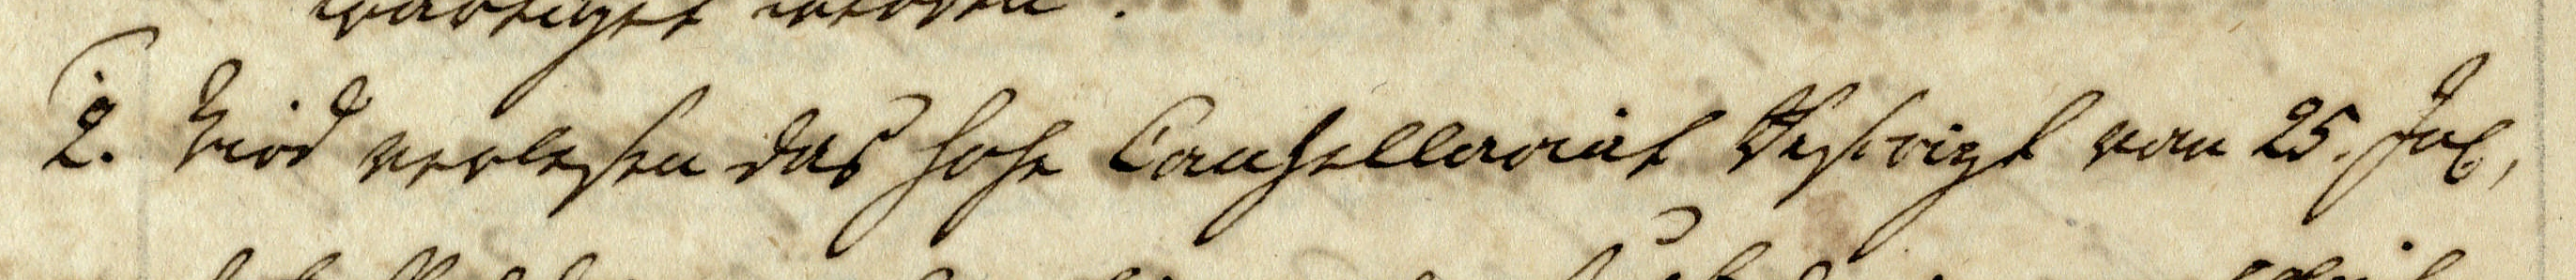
2. Wird verlesen das hohe Canzellariat Rescript vom 25, Jul.
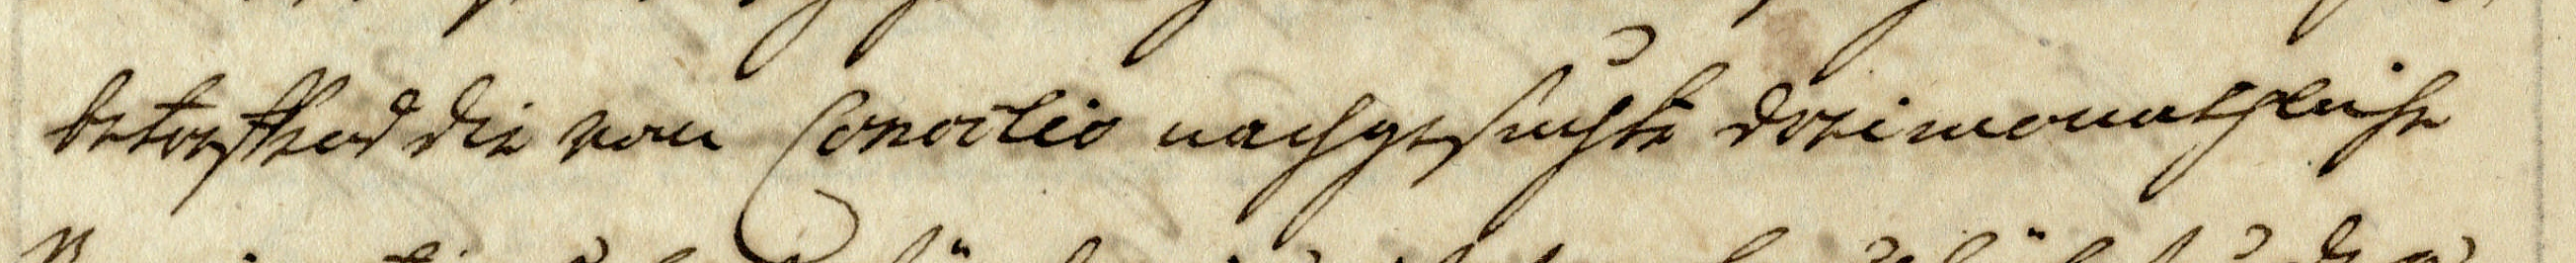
betreffend die vom Concilio nachgesuchte dreimonathliche
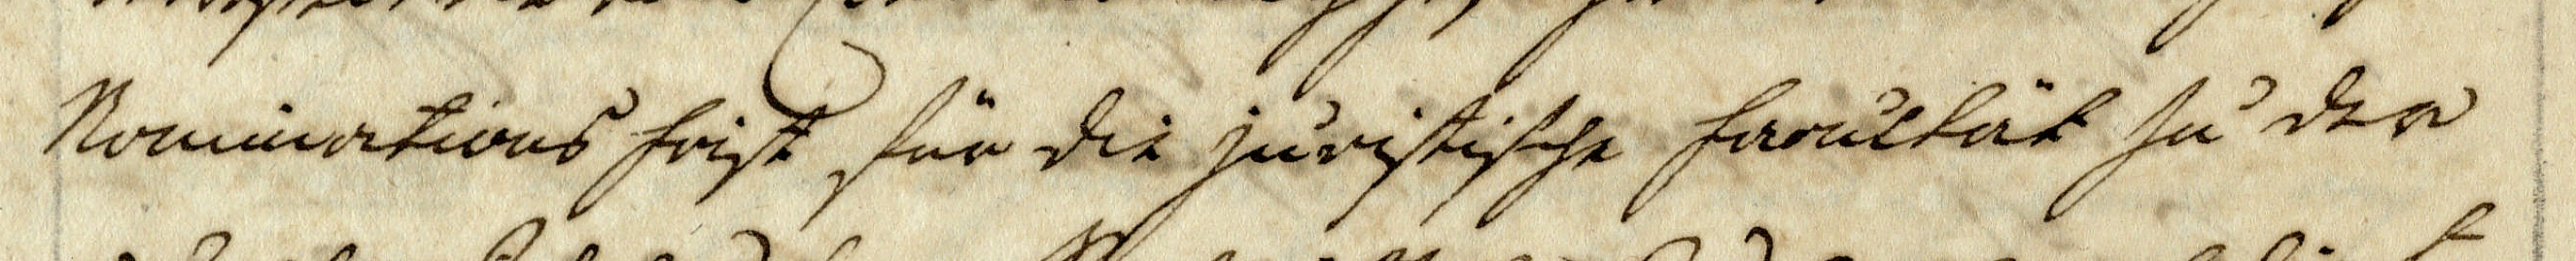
Nominations Frist für die juristische Facultät zu der
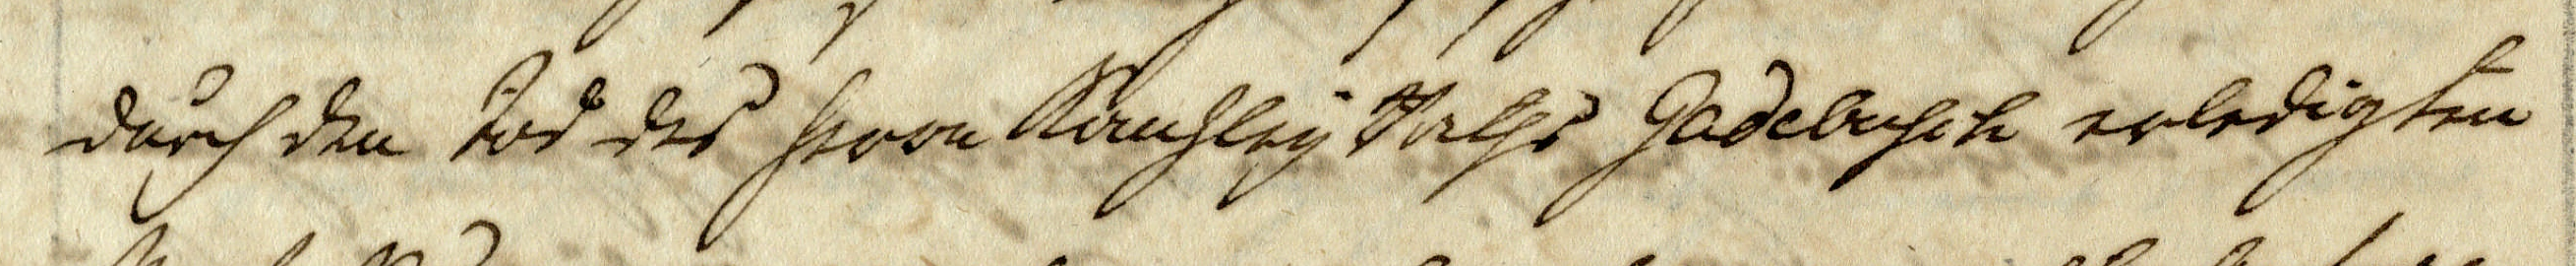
durch den Tod des Herrn Kanzleÿ Raths Gadebusch erledigten
